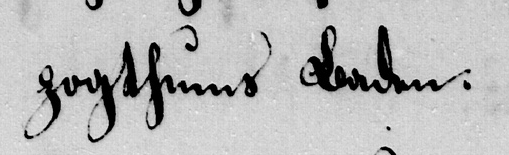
zogthums Baden.
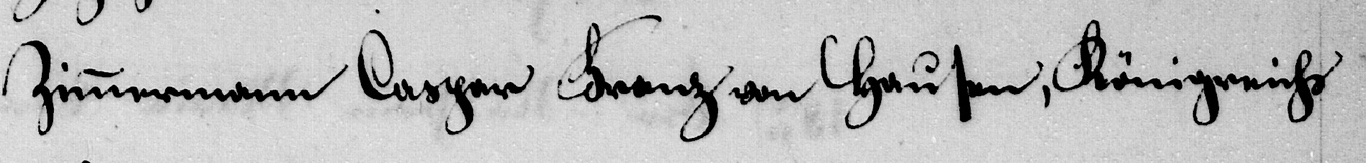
Zimmermann Caspar Franz von Hausen, Königreichs
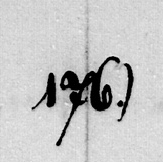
176.)
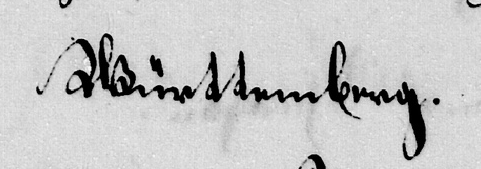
Württemberg.
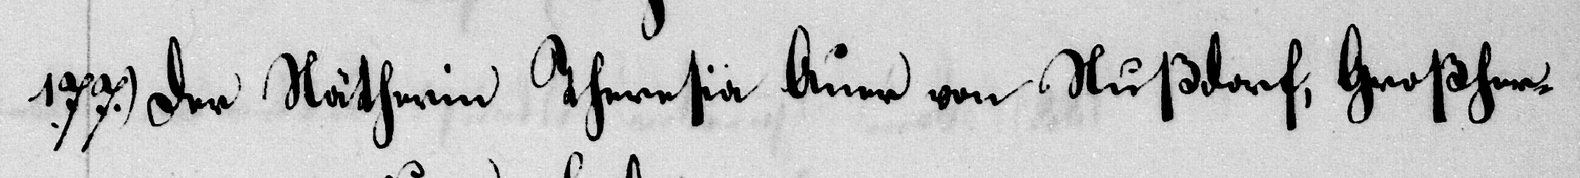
177.) Der Nätherin Theresia Auer von Nußdorf, Großher¬
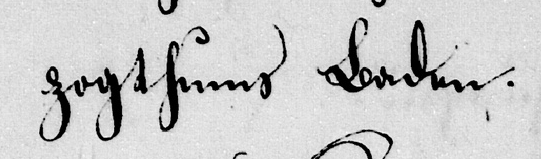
zogthums Baden.
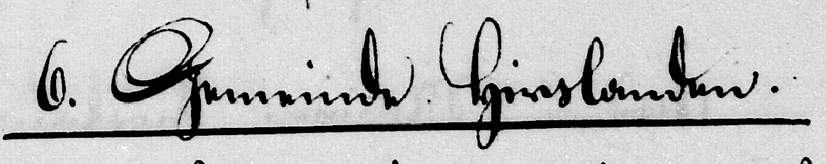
6. Gemeinde Hirslanden.
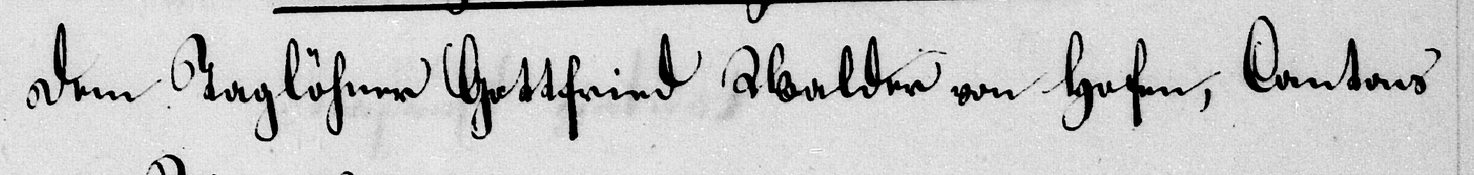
Dem Taglöhner Gottfried Walder von Hofen, Cantons
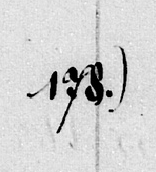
178.)
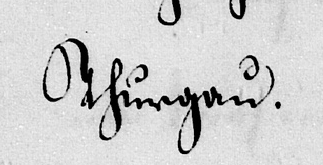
Thurgau.
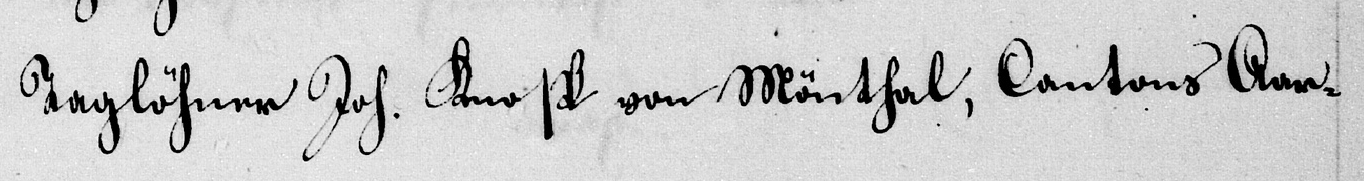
Taglöhner Joh. Knosp von Mönthal, Cantons Aar¬
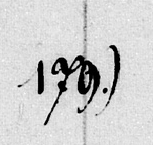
179.)
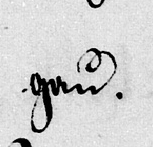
gau.
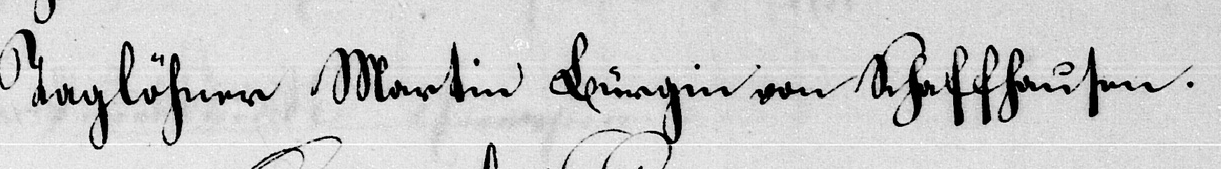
Taglöhner Martin Bürgin von Schaffhausen.
